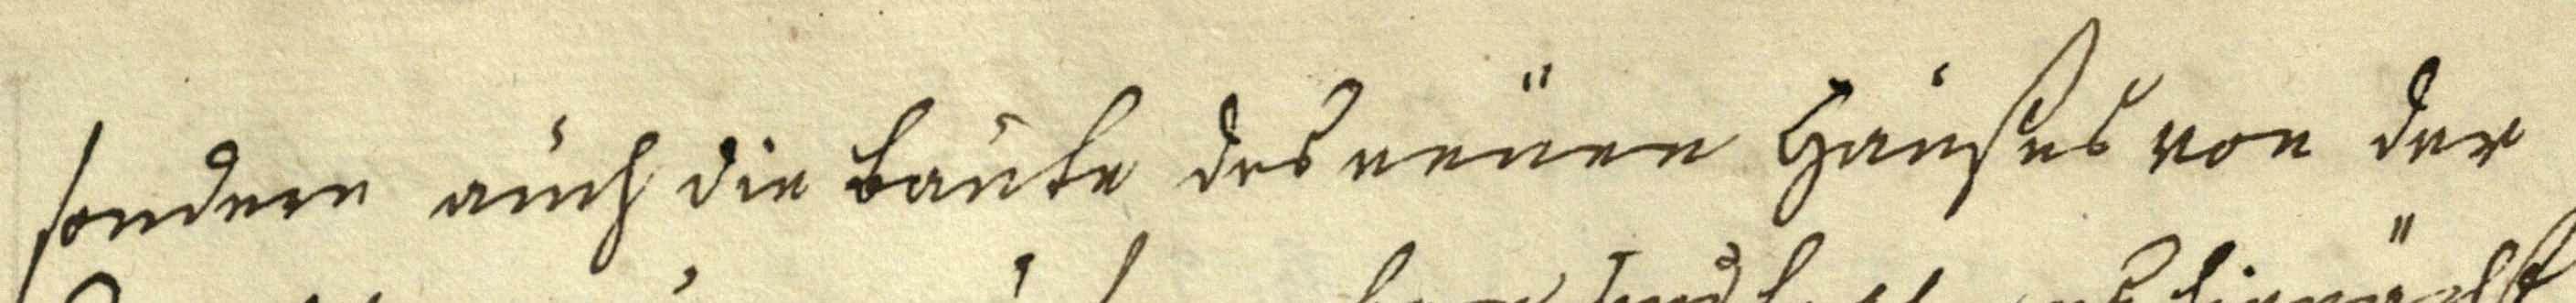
sondern auch die Baute des neuen Haußes von der
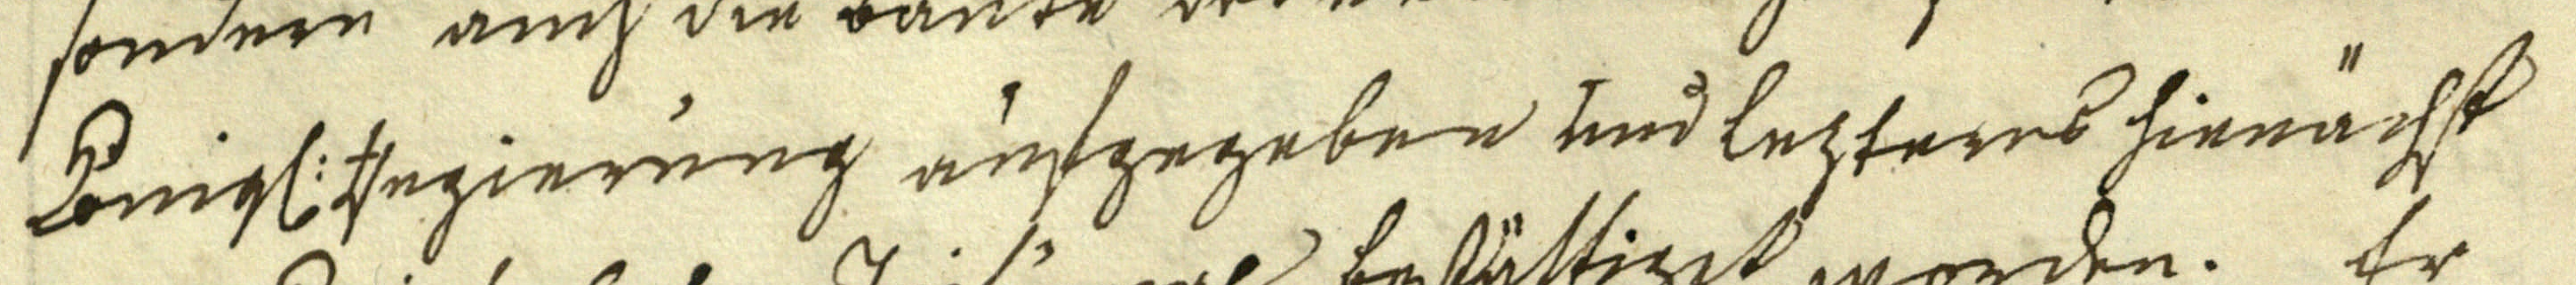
Königl. Regierung aufgegeben und lezteres hienächst
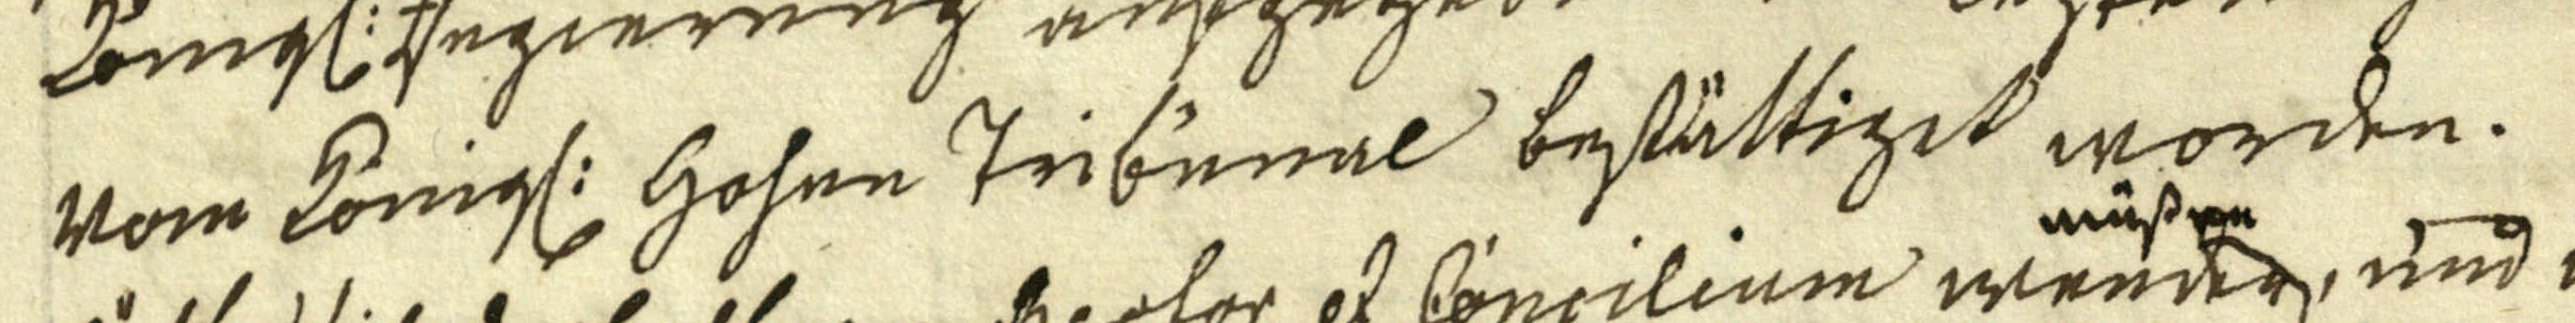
vom Königl. Hohen Tribunal bestättiget worden. Er
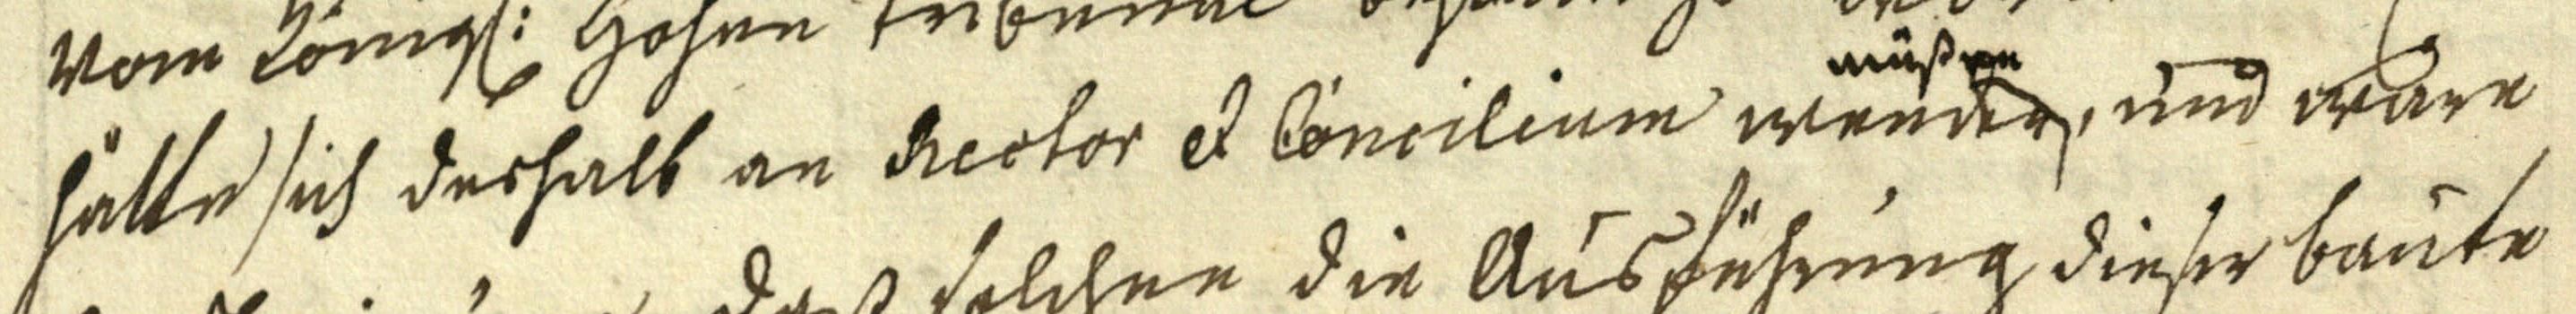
hätte sich deshalb an Rector et Concilium wenden müßen, und wäre
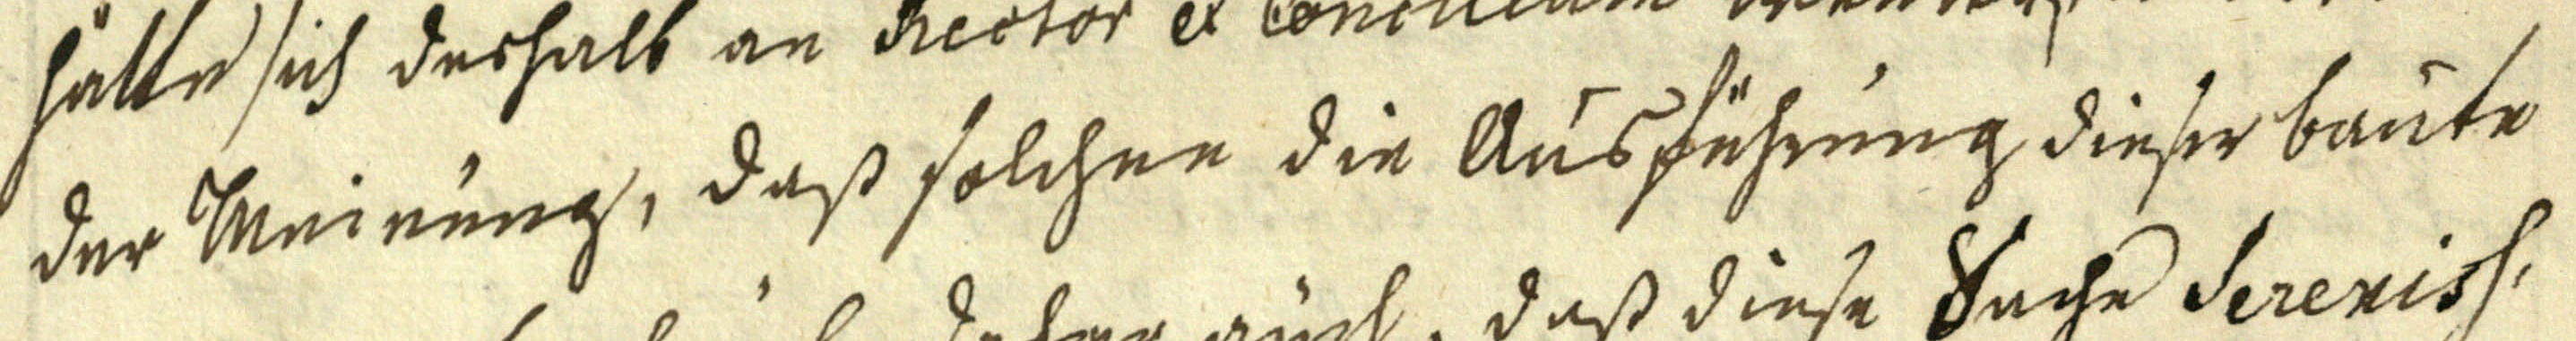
der Meinung, daß solchen die Ausführung dieser Baute
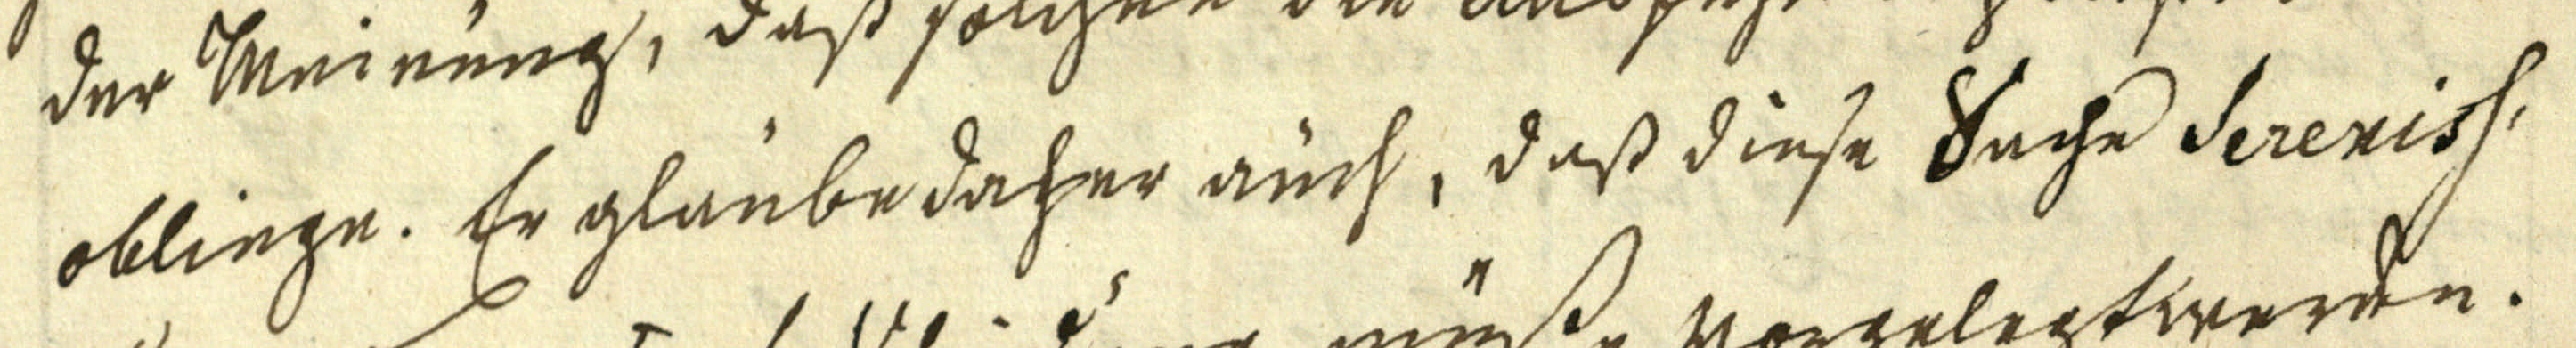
obliege. Er glaube daher auch, daß diese Sache Sereniss.
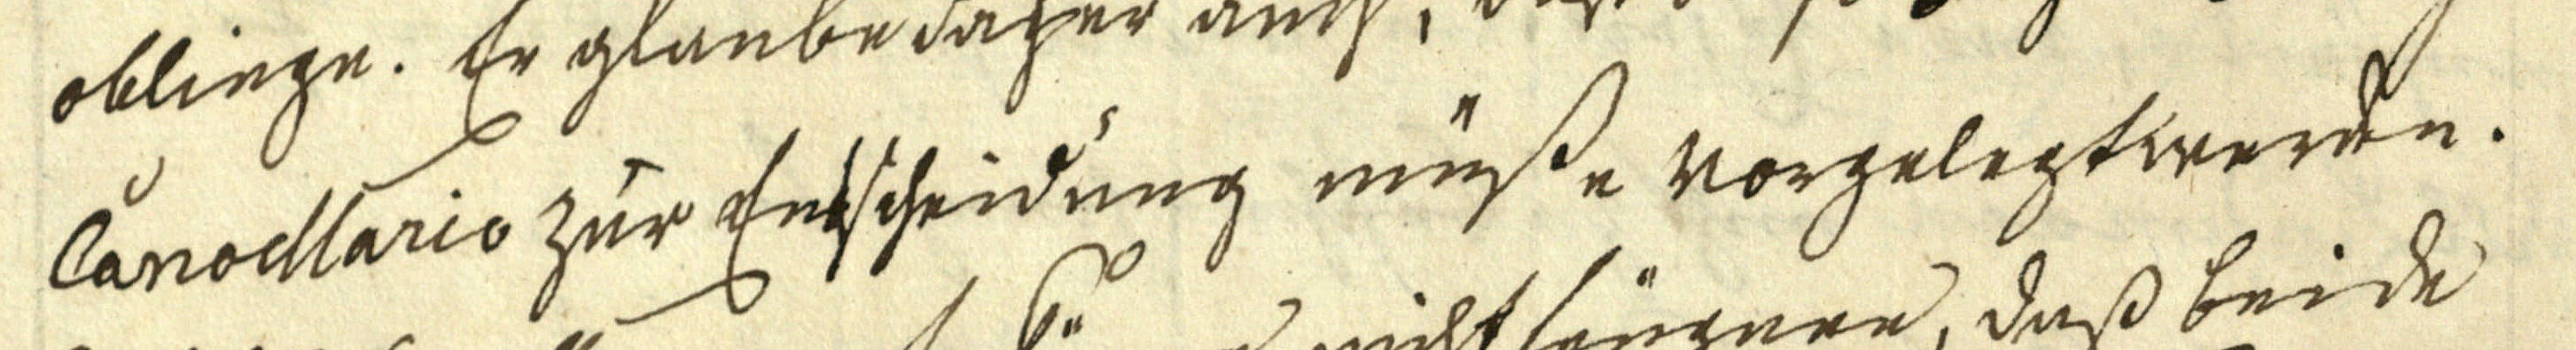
Cancellario zur Entscheidung müße vorgelegt werden.
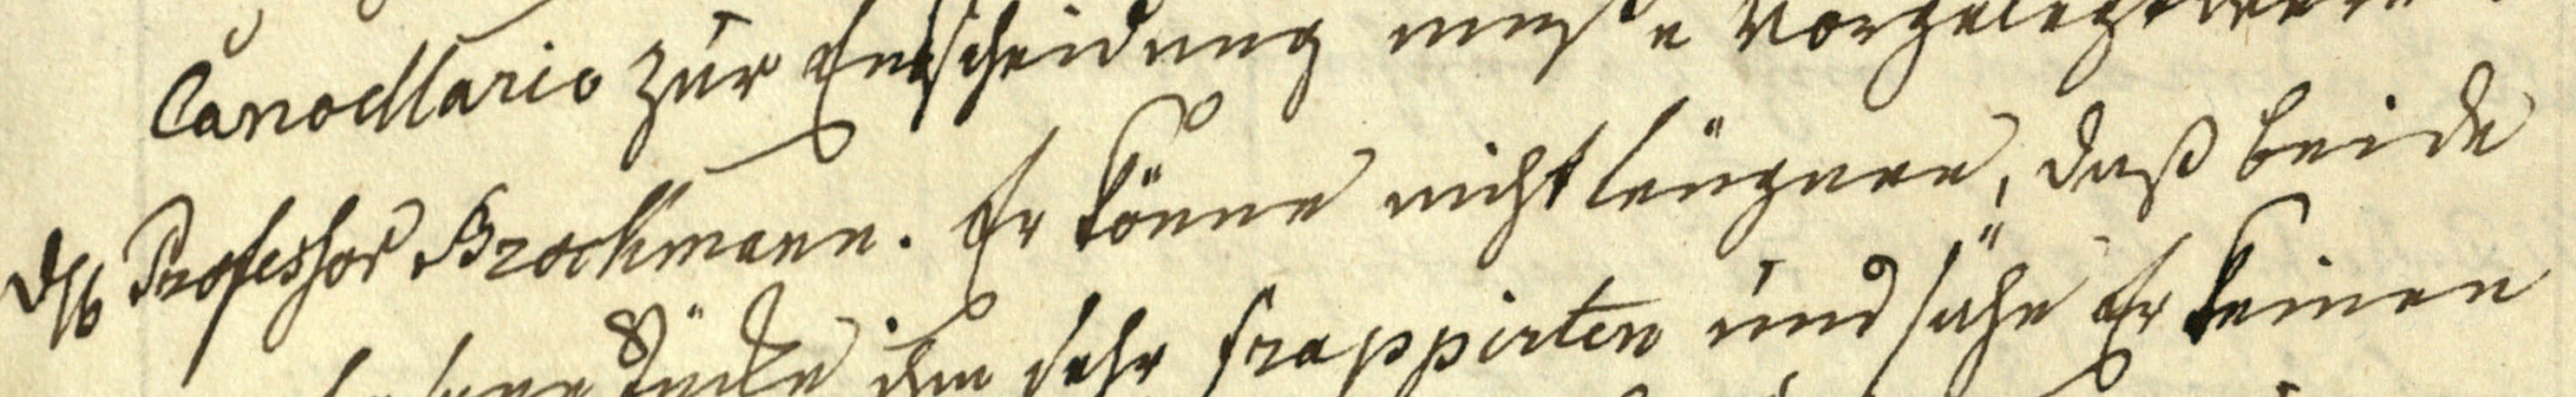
dh Professor Brockmann. Er könne nicht leugnen, daß beide
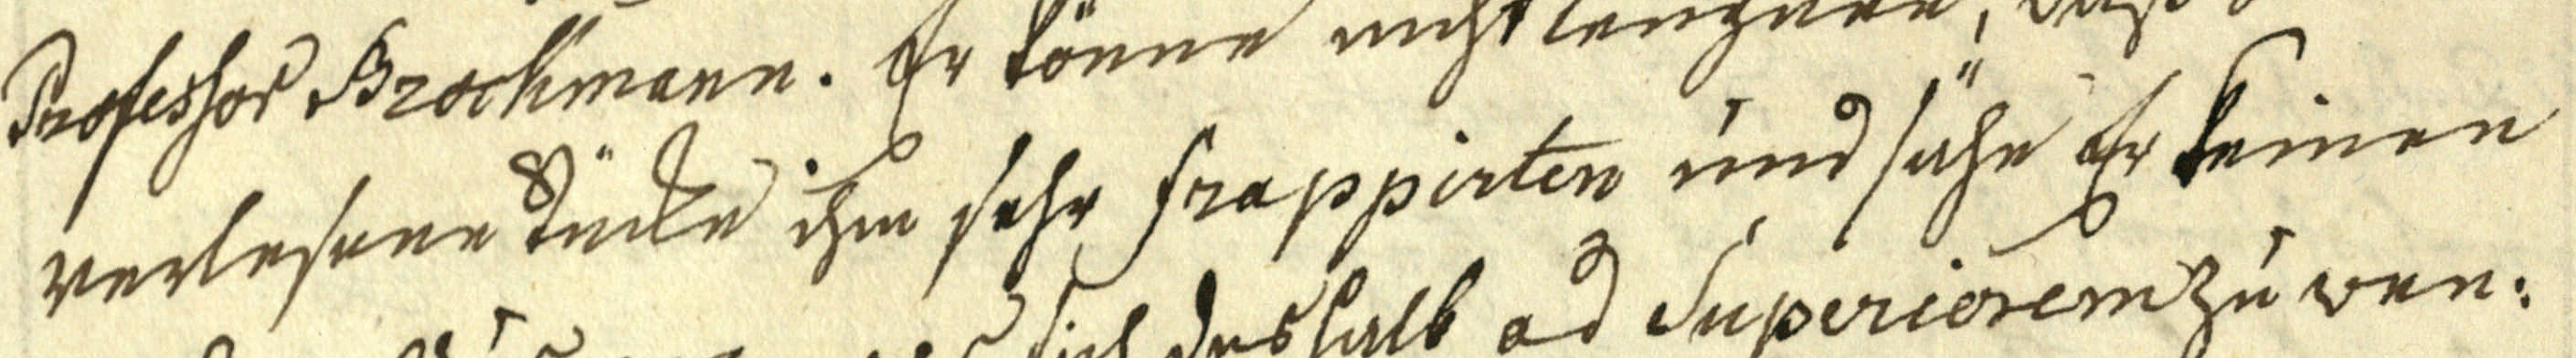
verlesene Stücke ihm sehr frappirten und sähe Er keinen
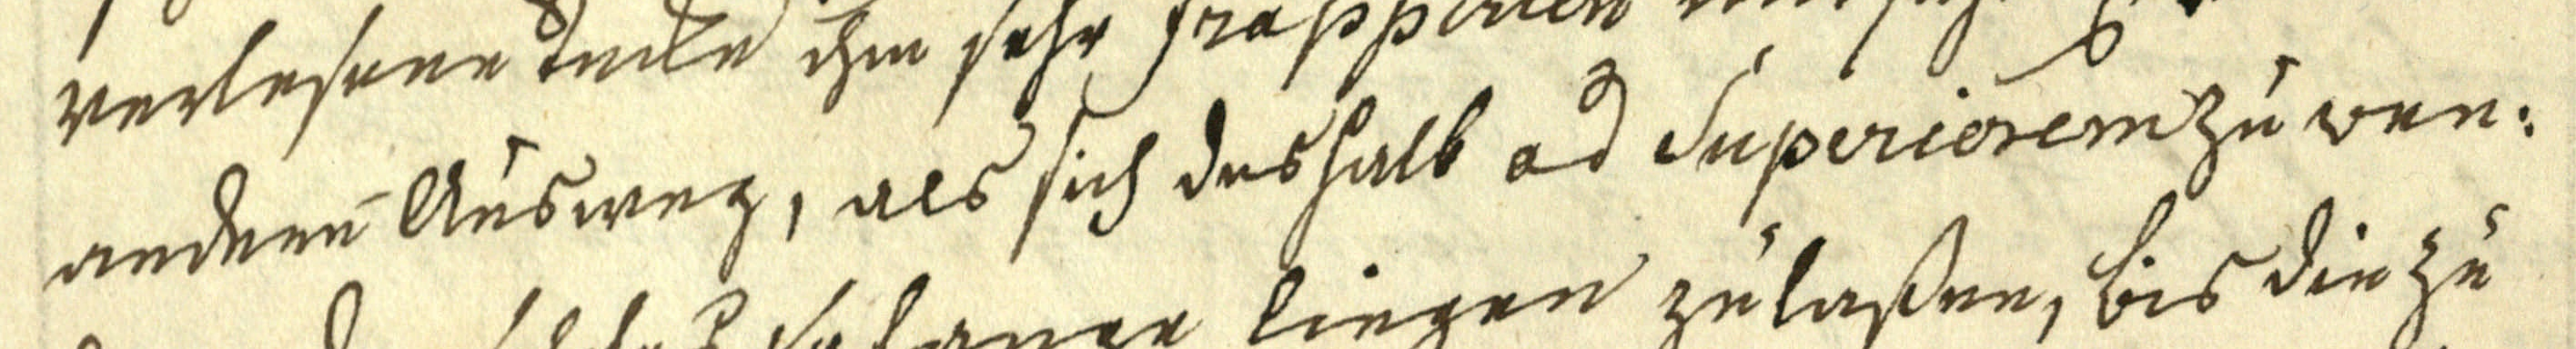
andern Ausweg, als sich deshalb an Superiorem zu wen¬
